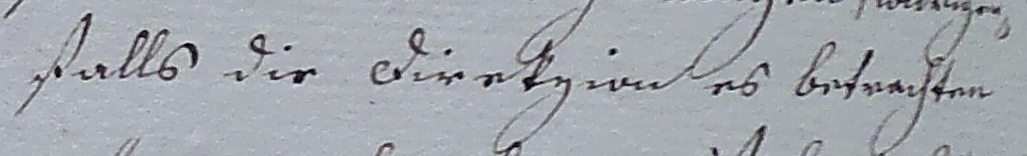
falls die Direkzion es betrachten
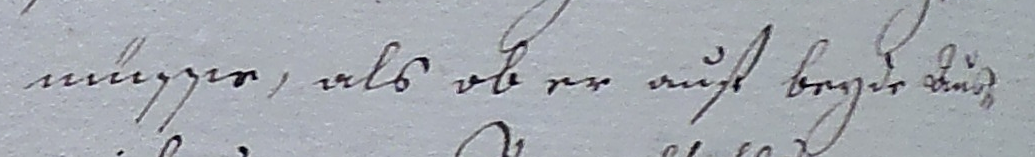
müsse, als ob er auf beyde Aus¬
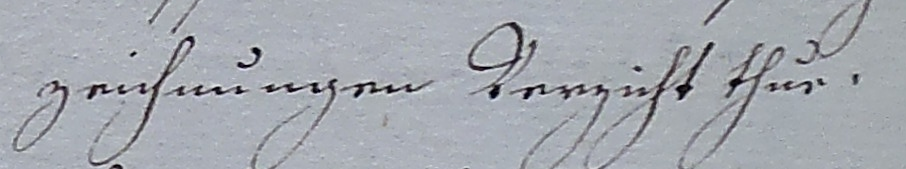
zeichnungen Verzicht thue.
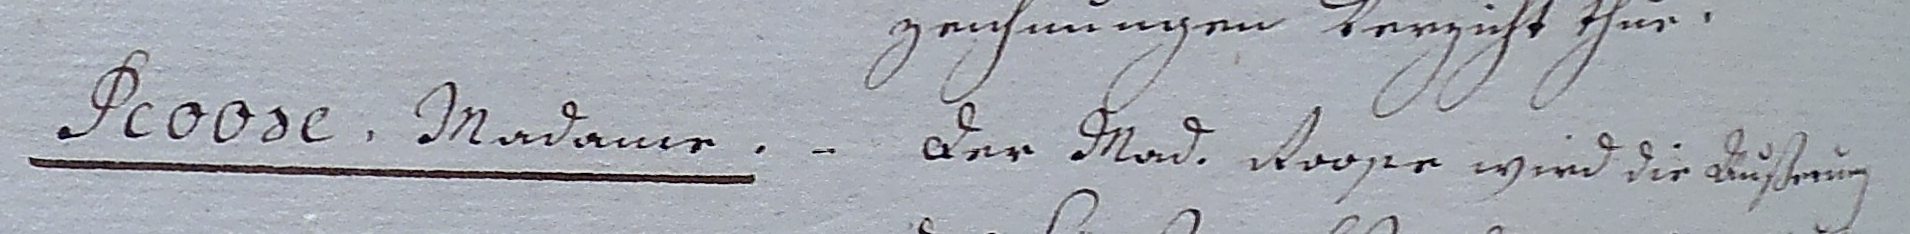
Roose., Madame. .. Der Mad. Roose wird die Außerung
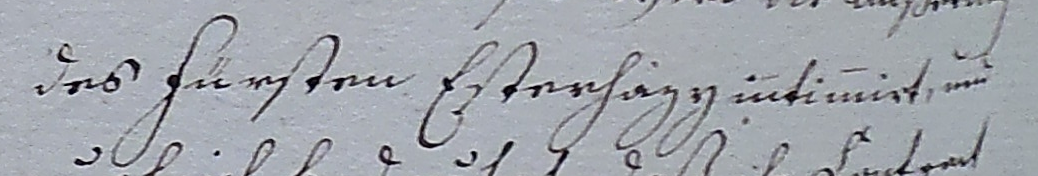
des Fürsten Esterhazy intim̅irt um
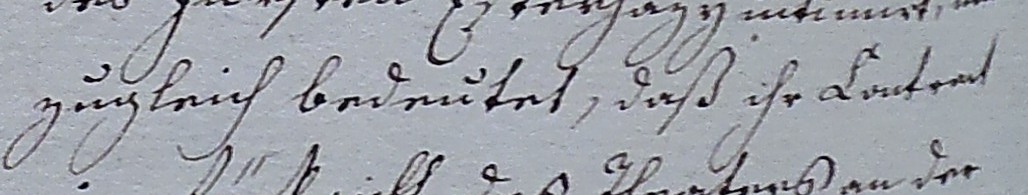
zugleich bedeutet, daß ihr Contract
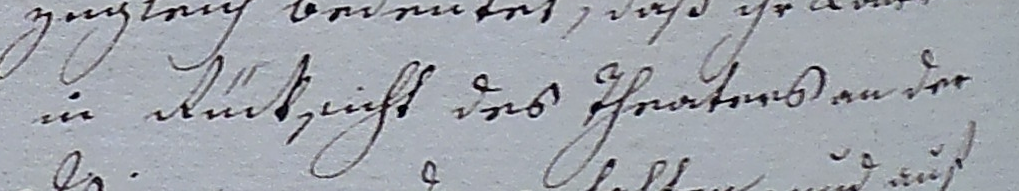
im Rücksicht des Theaters an der
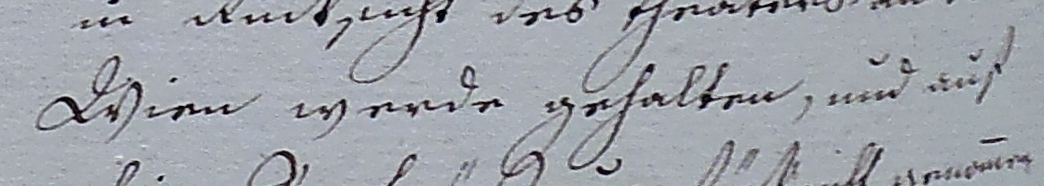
Wien werde gehalten, und auf
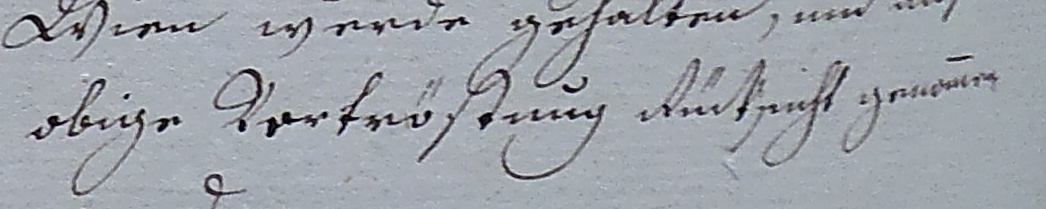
obige Vertröstung Rücksicht genom̅en
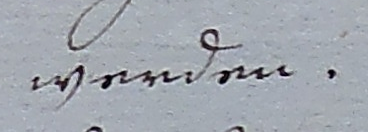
werden.
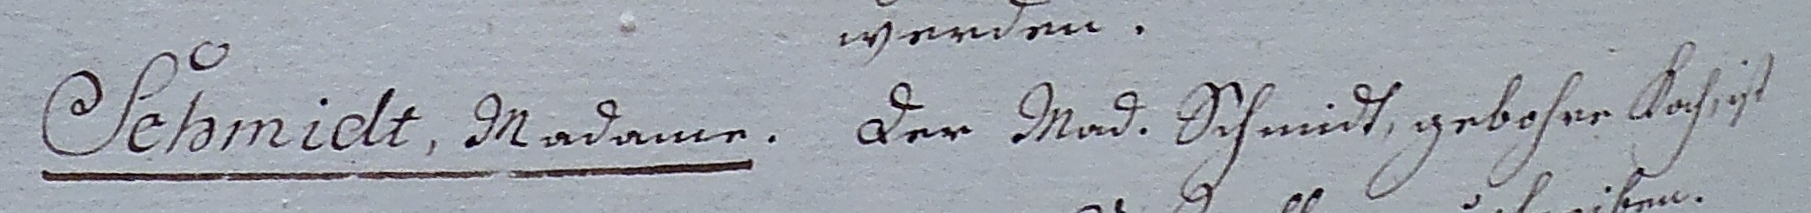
Schmidt, Madame. Der Mad. Schmidt gebohre Koch, ist
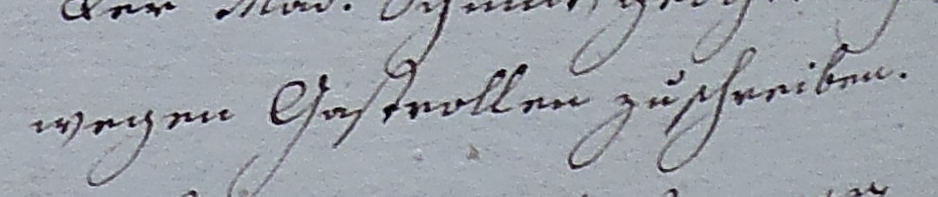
wegen Gastrollen zuschreiben.
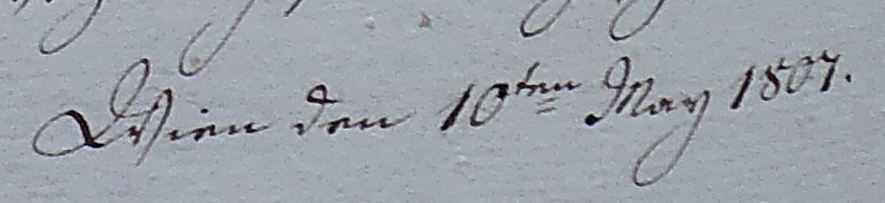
Wien den 10te͇n May 1807.
